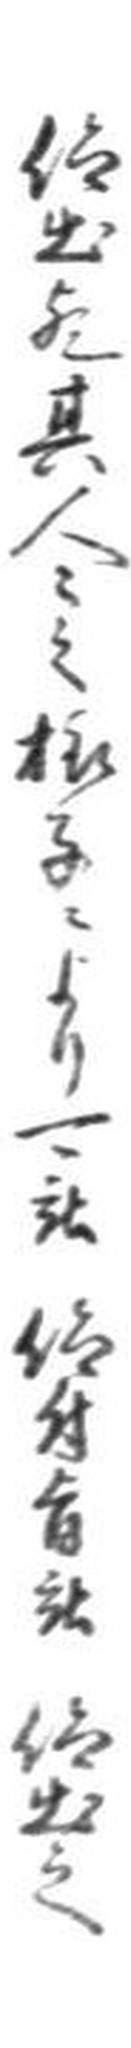仰出歟其人々之様子ニより可被仰付旨被仰出之
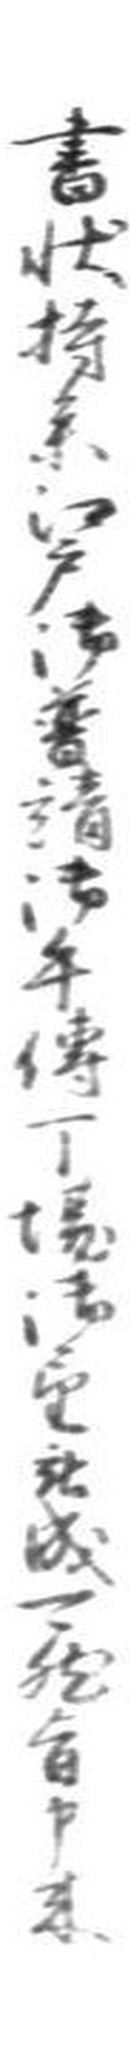書状持参江戸御普請御手伝丁場御望被成可然旨申来

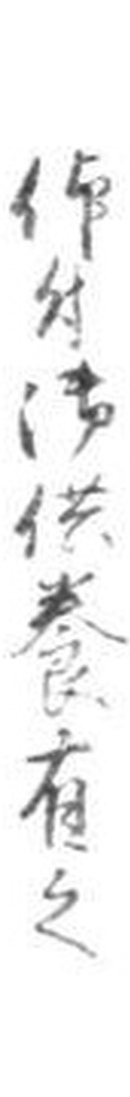仰付御供養有之
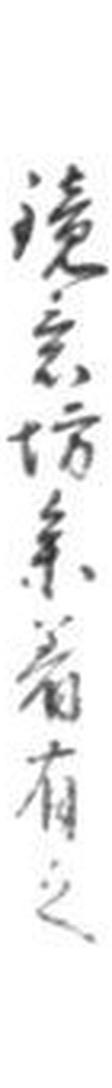鏡意坊参着有之
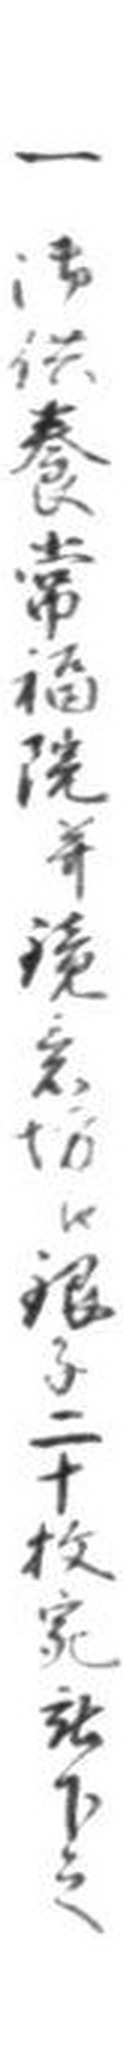一御供養常福院并鏡意坊江銀子二十枚宛被下之
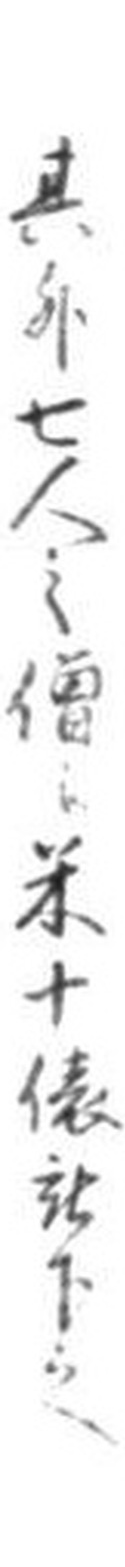其外七人之僧江米十俵被下之
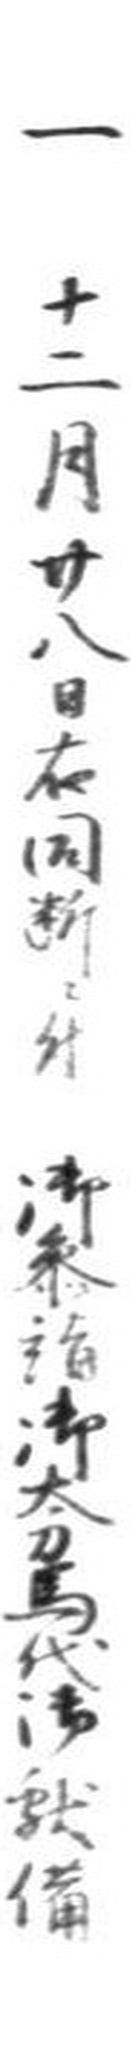一十二月廿八日右同断ニ付御参詣御太刀馬代御献備
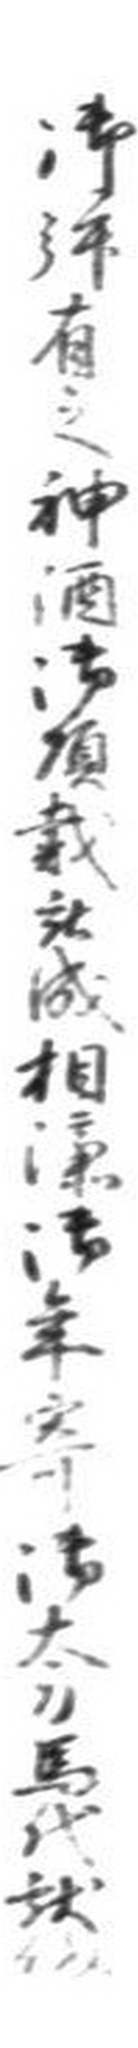御拝有之神酒御頂戴被成相済御年寄御太刀馬代献備
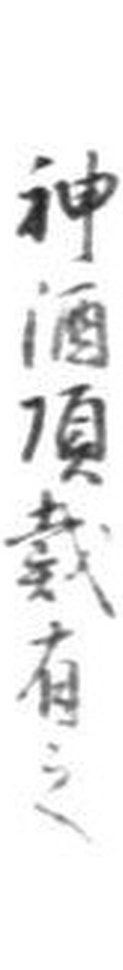神酒頂戴有之
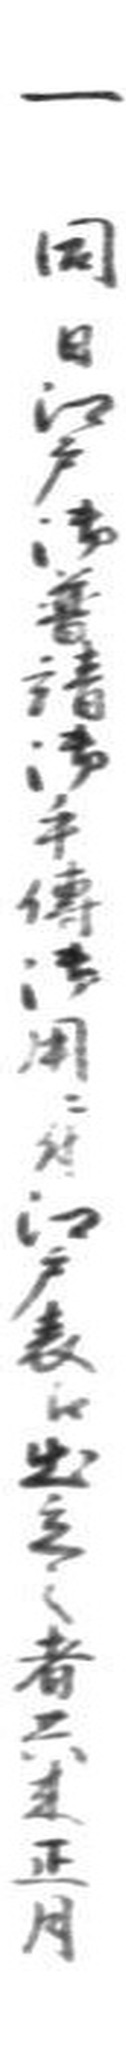一同日江戸御普請御手伝御用ニ付江戸表江出立之者共来正月
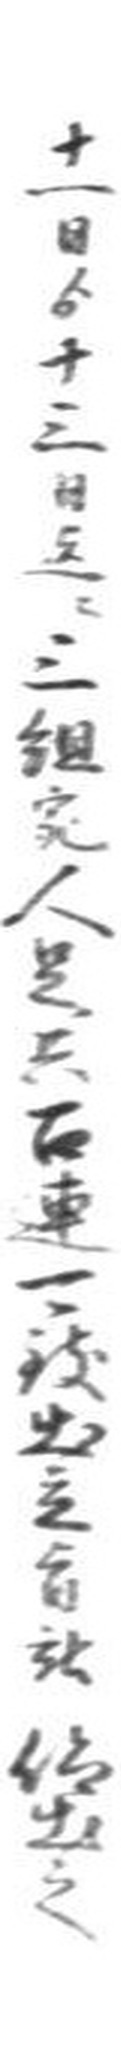十一日ゟ十三日迄ニ三組宛人足共召連可致出立旨被仰出之

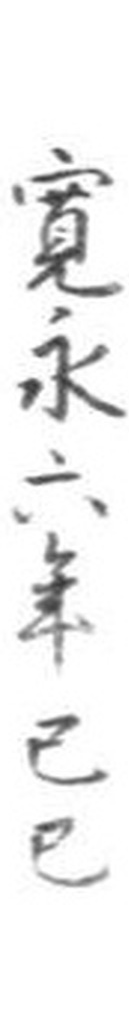寛永六年己巳
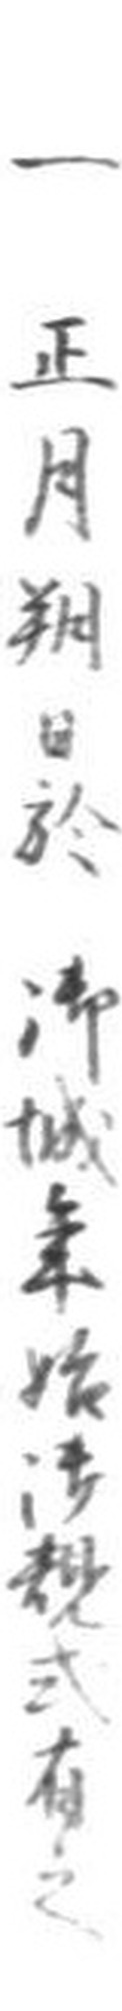一正月朔日於御城年始御規式有之
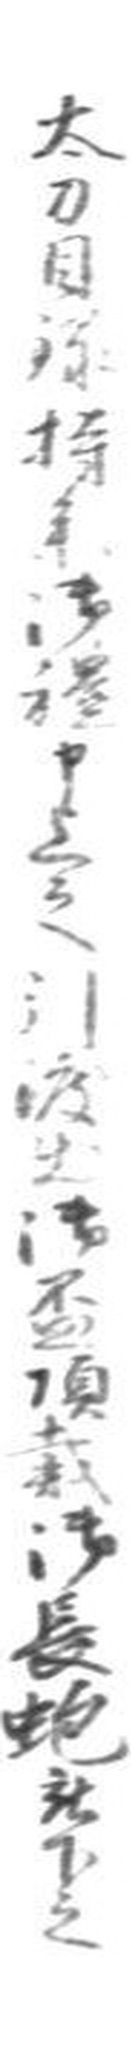太刀目録持参御礼申上之引渡出御盃頂戴御長蚫被下之
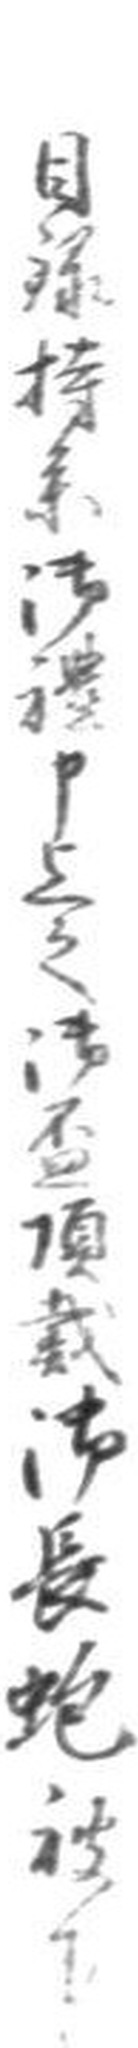目録持参御礼申上之御盃頂戴御長蚫被下之
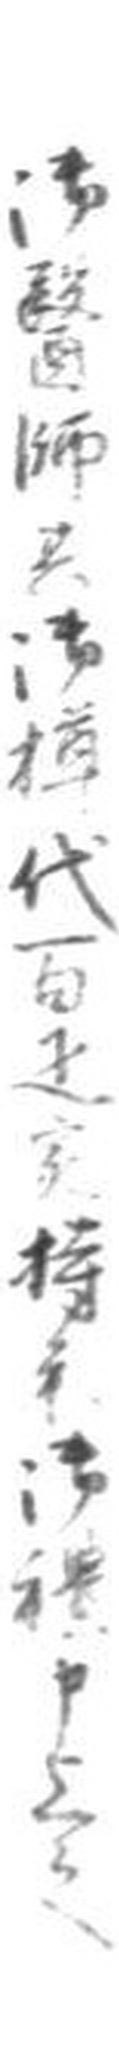御医師共御樽代百疋宛持参御礼申上之
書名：家譜 三 忠昌公 従慶長八年到寛永六年
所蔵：福井県文書館 Fukui Prefectural Archives
